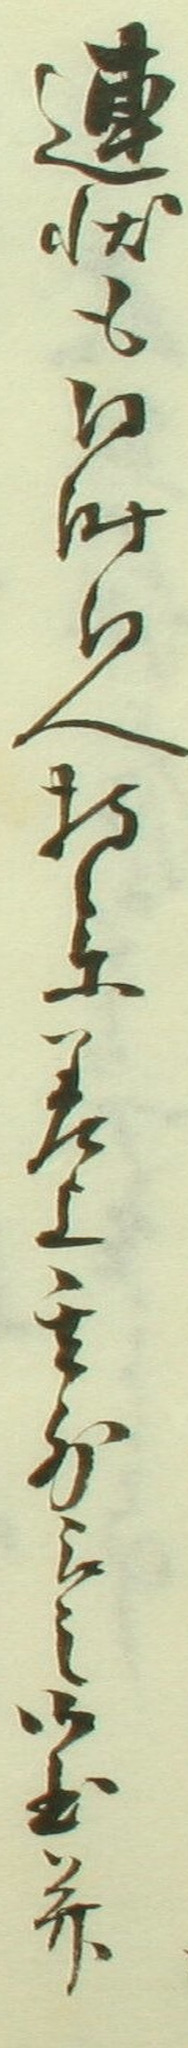連状も同時同人持参差上其外江之御書并
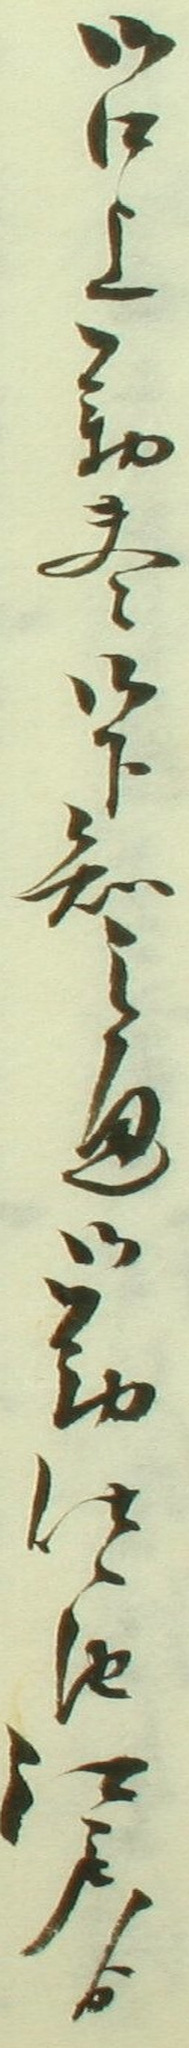御口上勤夫々御下知之通御勤仕候由江戸ゟ
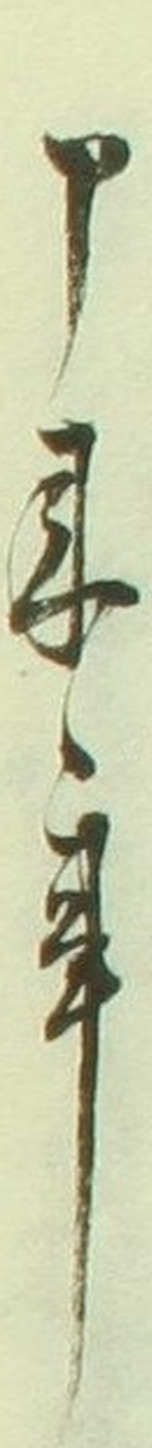申来候事
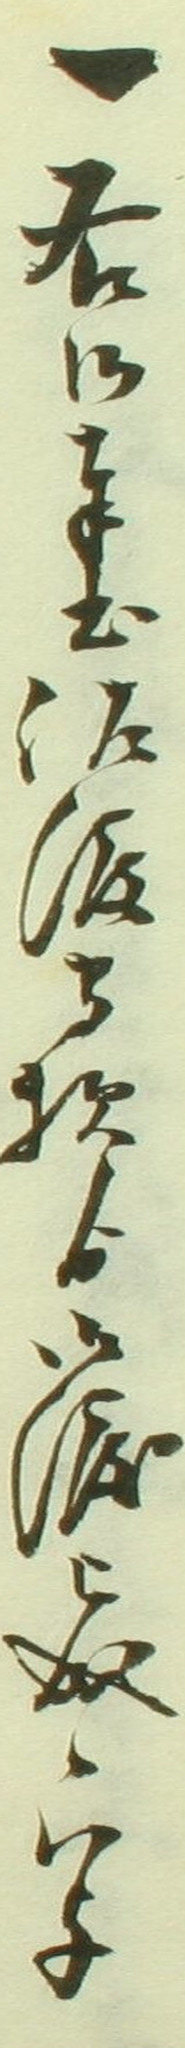一右御奉書佐渡守様ゟ御渡被成候写
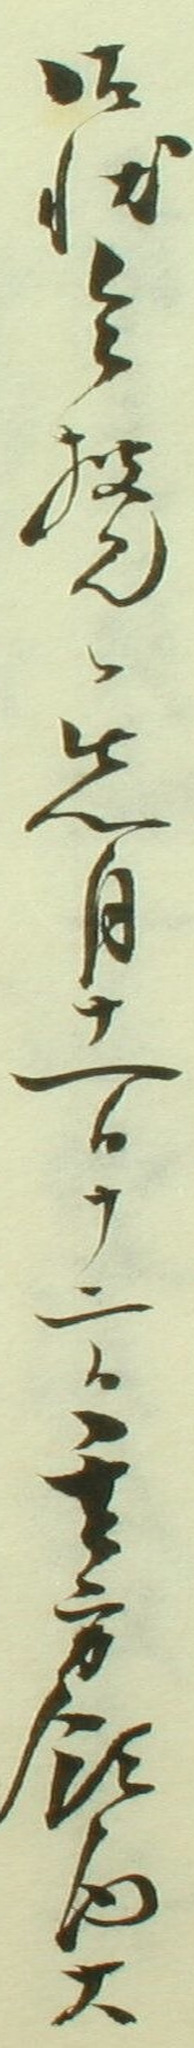御状令被見候先月十一日十二日其方領内大
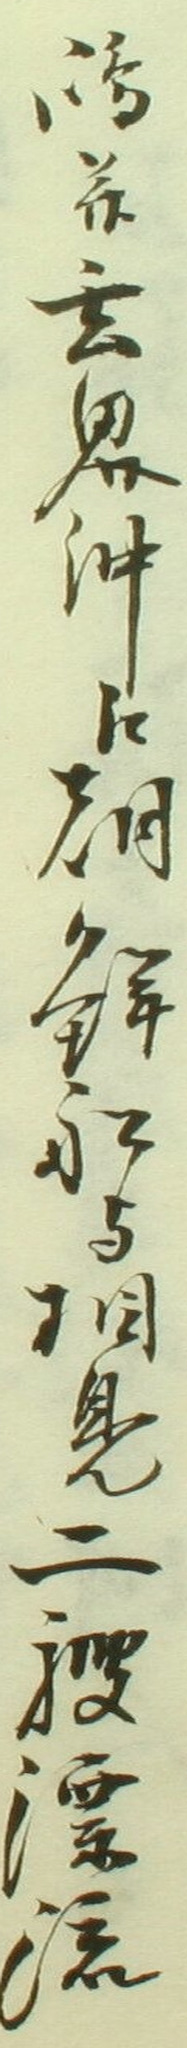嶋幷玄海沖へ朝鮮船と相見二艘漂流
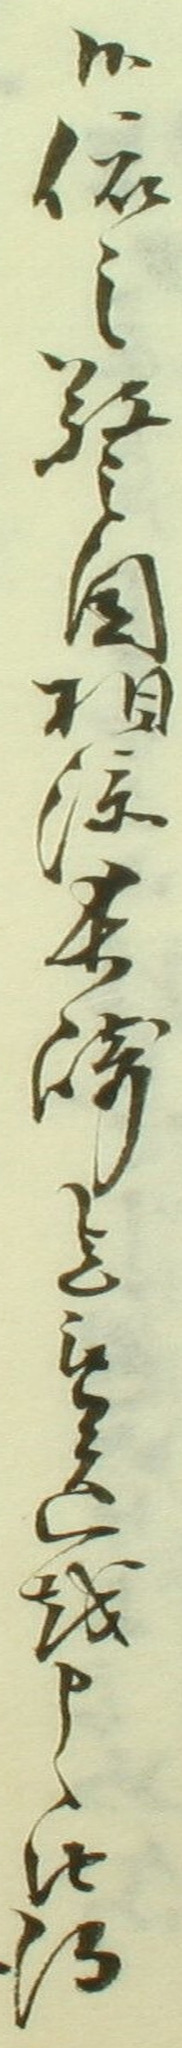候依之警固相添長崎迄被送越申候由得
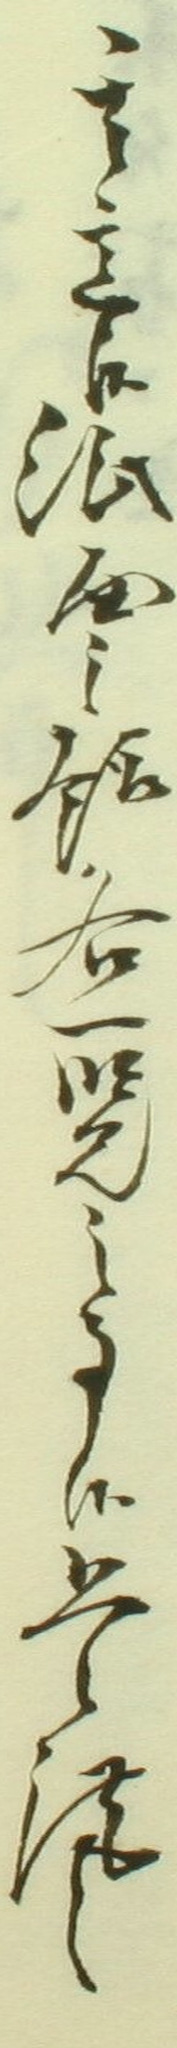其意候紙面之趣一覧之事候恐々謹言
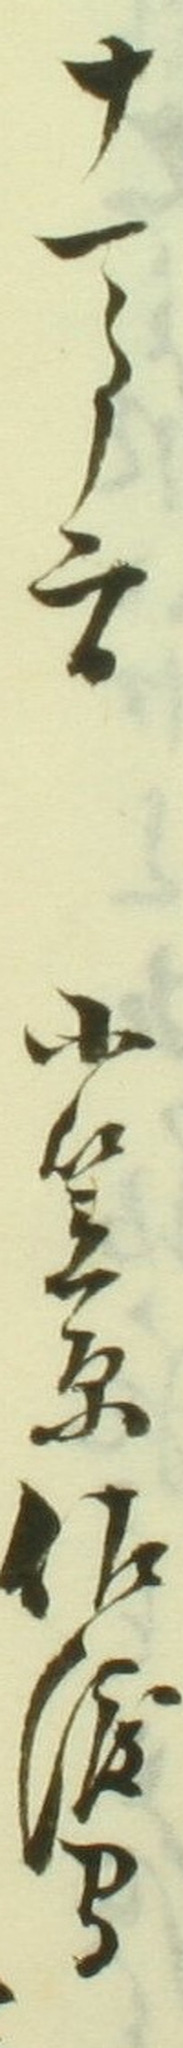十一月二日小笠原佐渡守
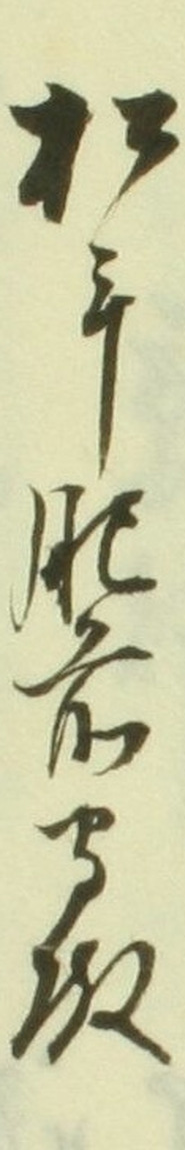松平肥前守殿
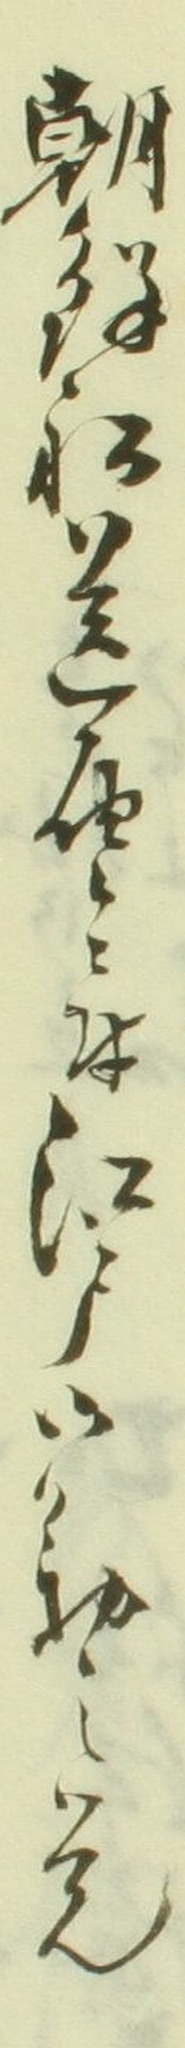朝鮮船送届候ニ付江戸御勤之覚
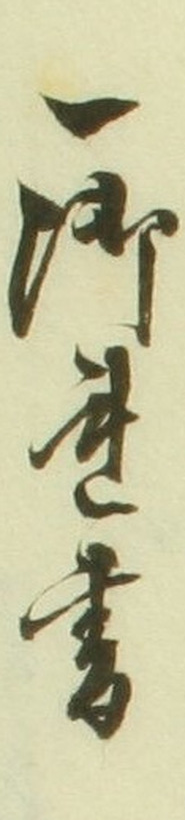一御連書
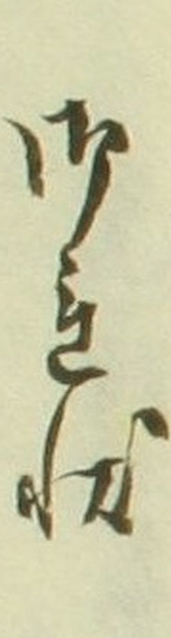御連状
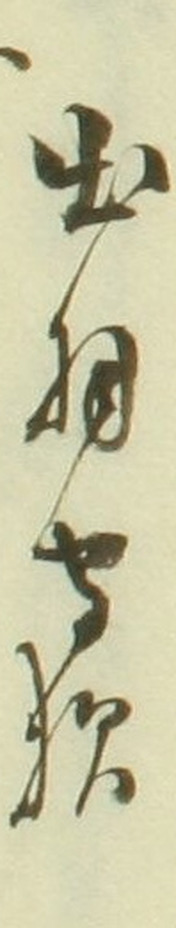出羽守様
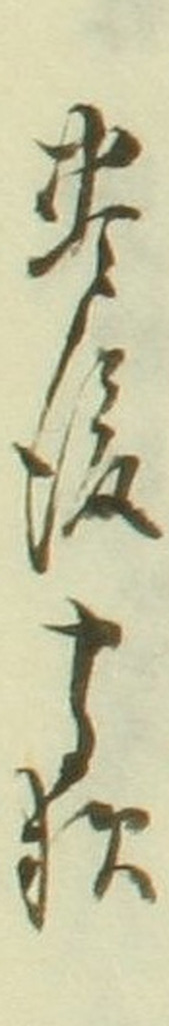豊後守様
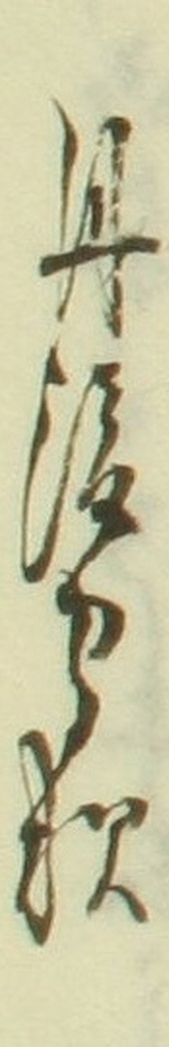丹後守様
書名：異国船漂着記
